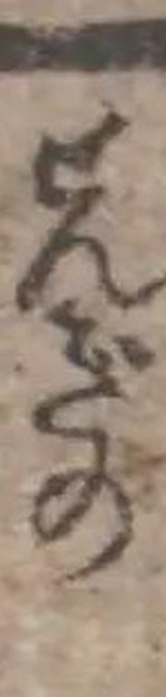せんぎの
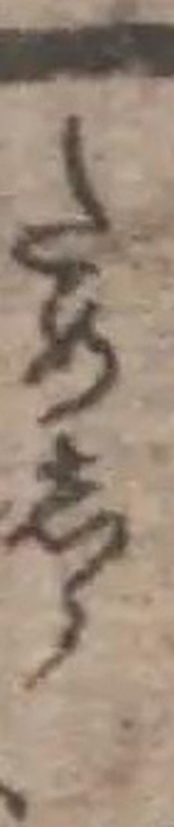ためしら
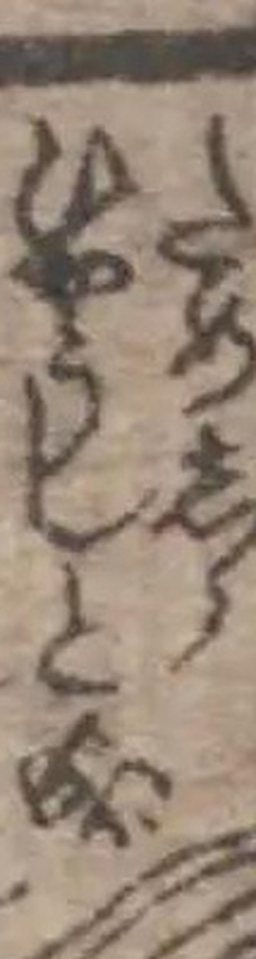ひやうしと成
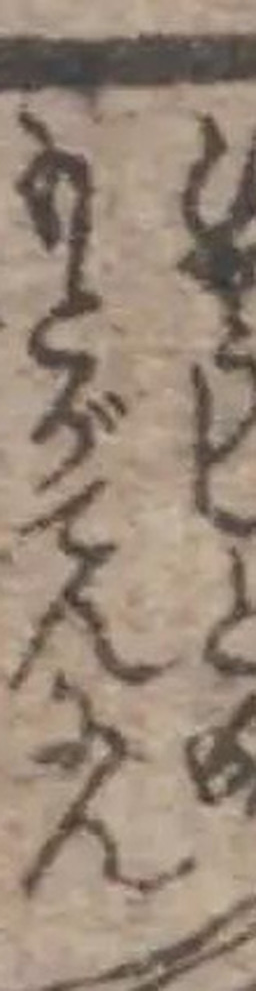もとがてんにん
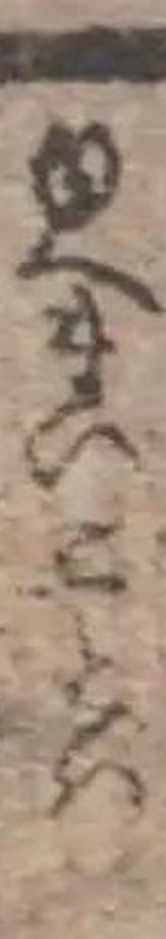ゆへまいことハ
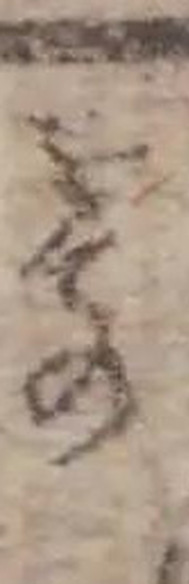をても

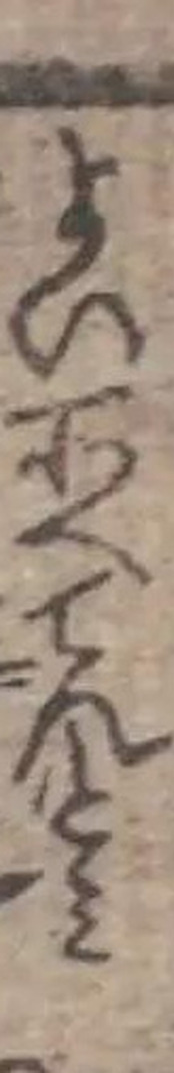よい所へてんとミ
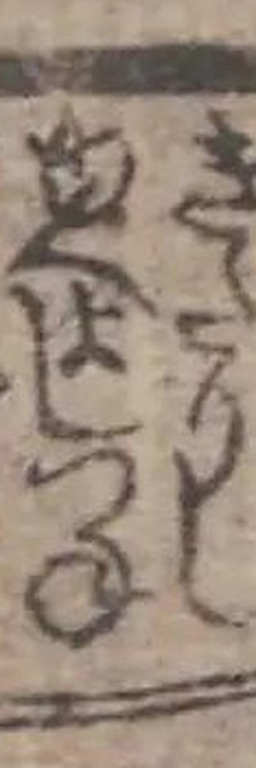ゆへよしつね
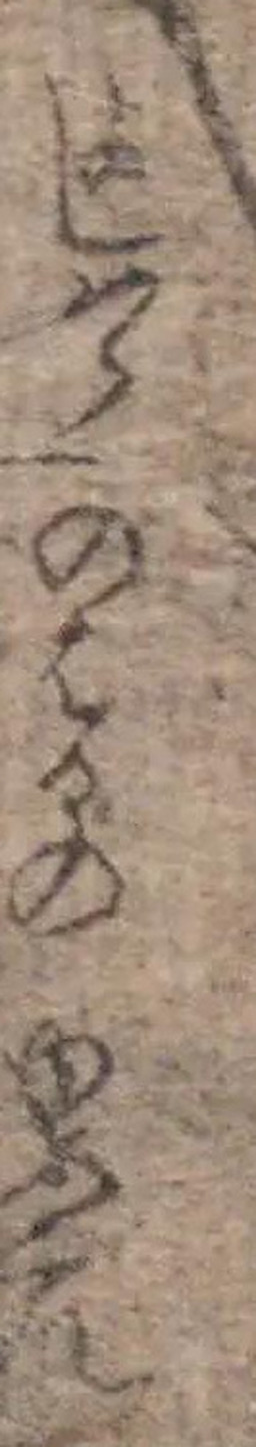よしハらのはるのゆふぐれ
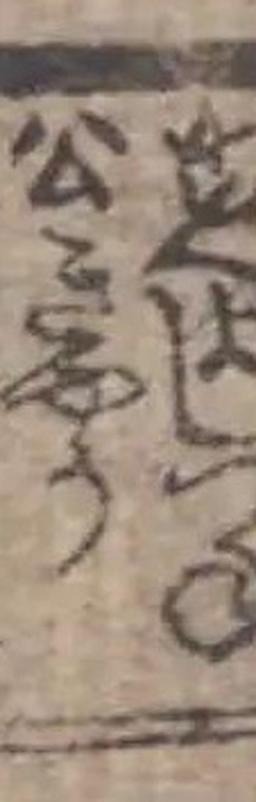公きやう
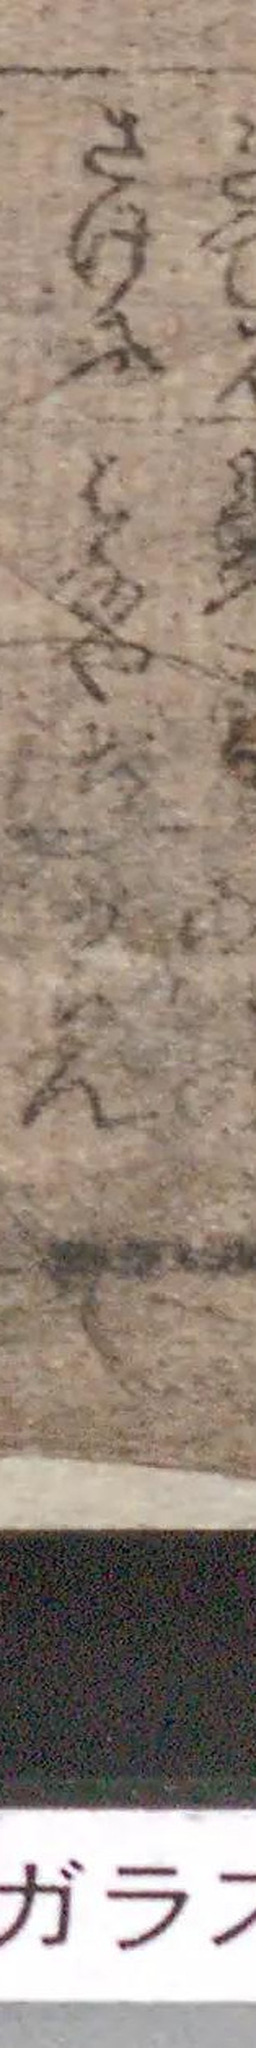さけにはなやちるらん
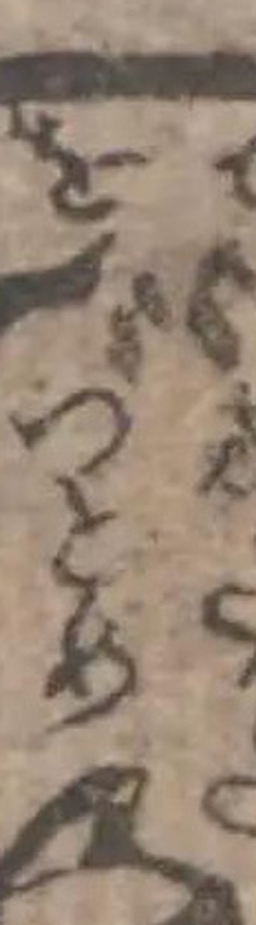をつとめ
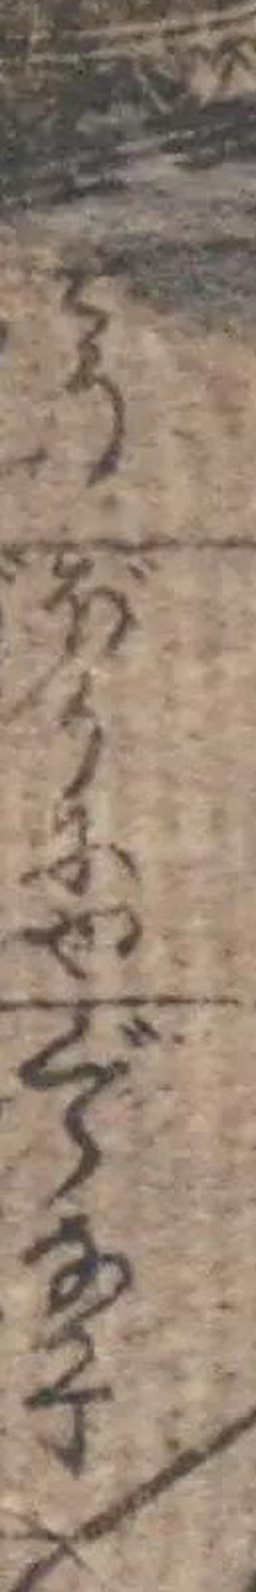せうぼりにやぐらなか丁
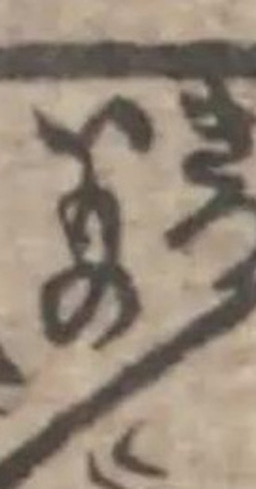いもの
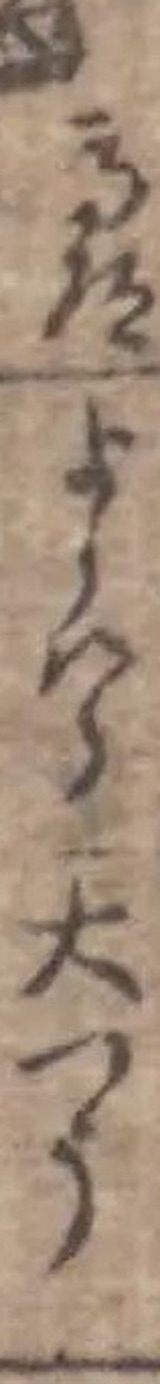高道よしハら大つう
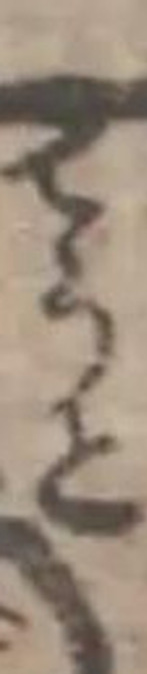てうと
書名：草紙の曙 3巻
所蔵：国立国会図書館 National Diet Library, JAPAN
